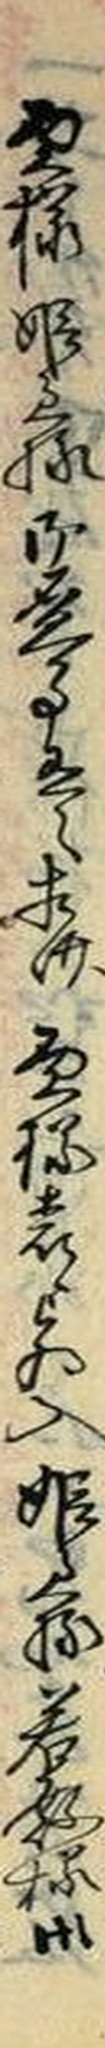殿様姫君様御盃事有之相済殿様表へ被為入姫君様若殿様御
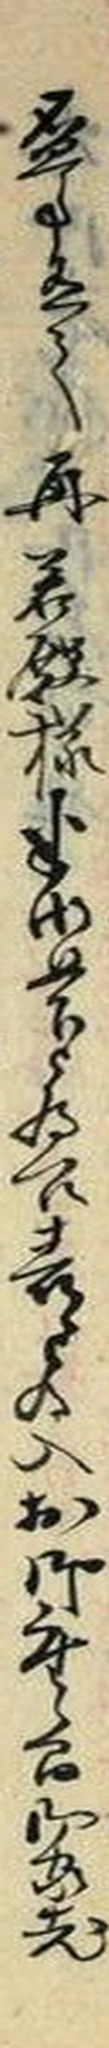盃事有之再若殿様半御上下被為召表へ被為入於御座之間御家老
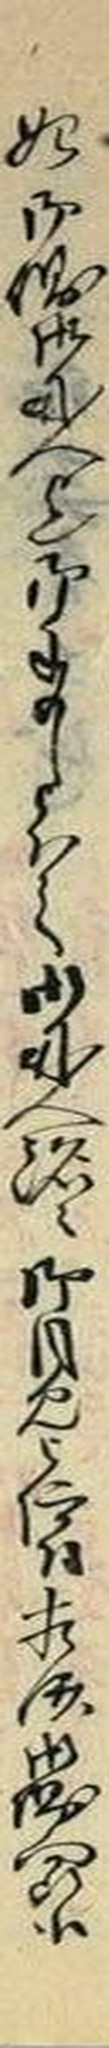始御側御用人迄御手のし被下之御用人銘々御目見被仰付相済御側向頭取
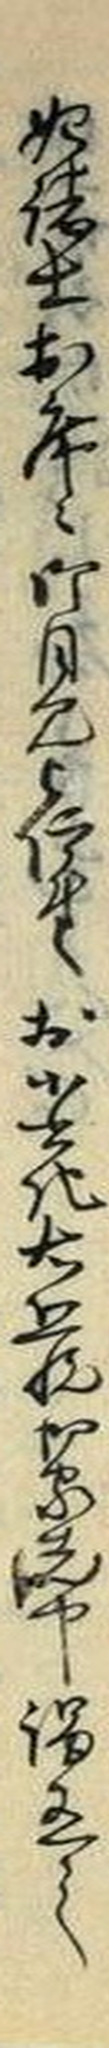始諸士於席々御目見被仰付候於小書院右恐悦御家老中謁有之
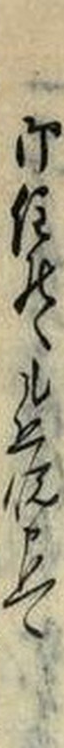御住居へも恐悦申上候
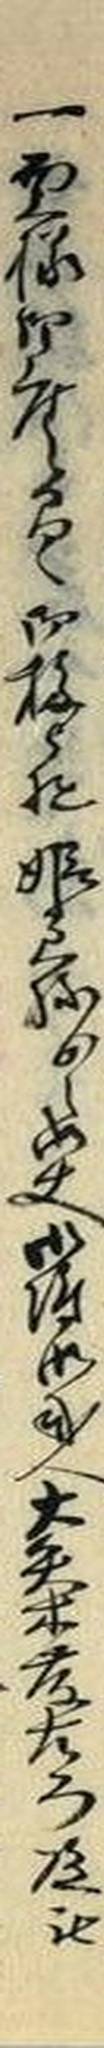一殿様御座之間へ御移被遊姫君様ゟ之御使御附御用人大谷木藤左衛門殿被
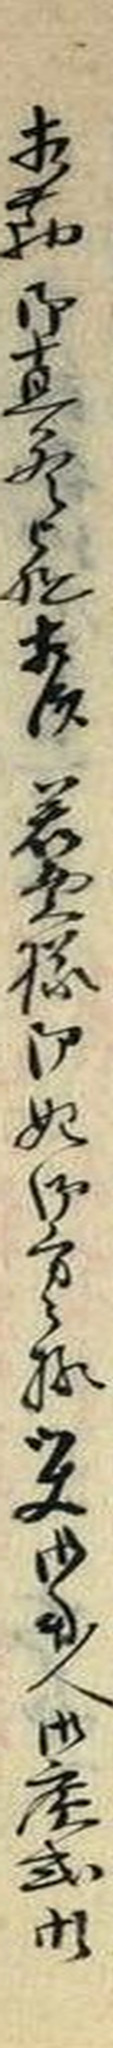相勤御直答被遊相済若殿様御始御方々様御使御用人御広式御
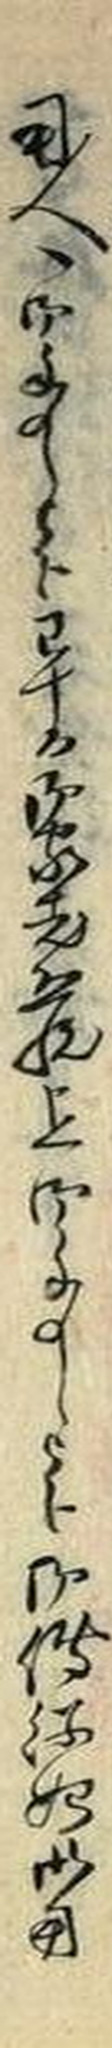用人へ御手のし被下畢而御家老恐悦申上御手のし被下御傅役始御用
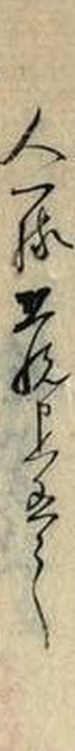人一統恐悦申上有之
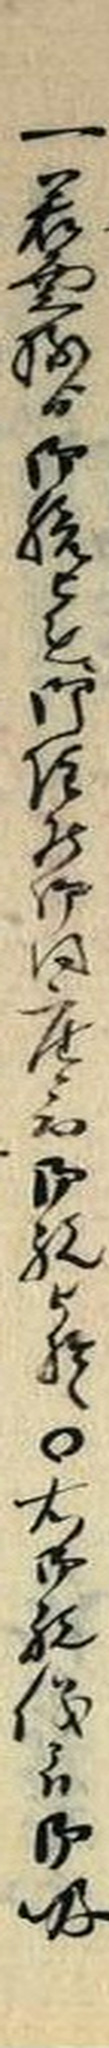一若殿様ゟ御膳被進御住居御同座ニ而御祝被遊候〇右御祝儀ニ付御吸
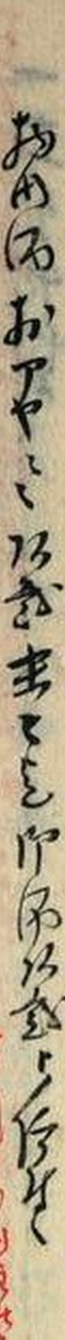物御酒於部や〃〃頂戴未々迄御酒頂戴被仰付候
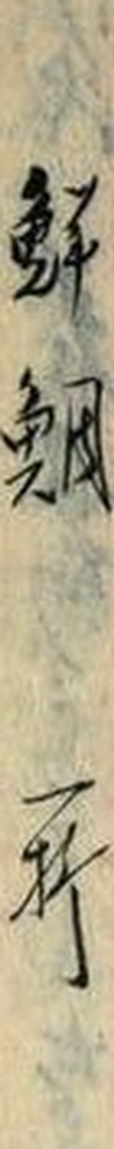鮮鯛一折
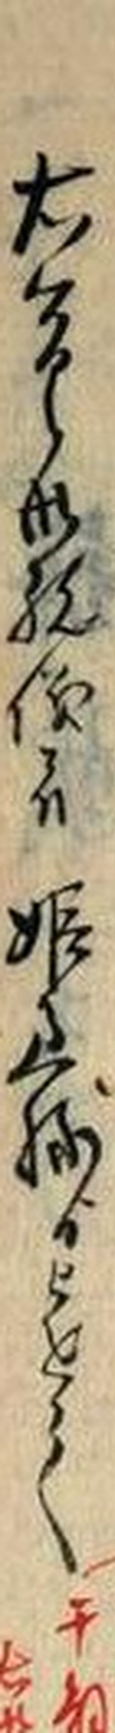右今日之御祝儀ニ付姫君様ゟ被進之

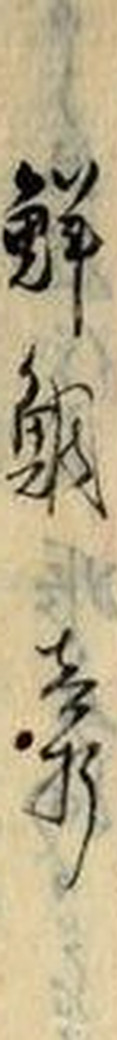鮮鯛壱折
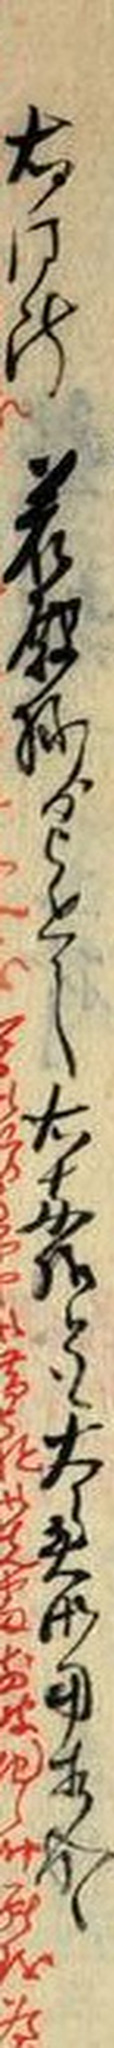右同断若殿様ゟ被進之右両様とも大奥御用相成候
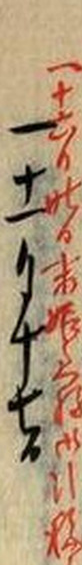一十一月十七日
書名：少傅日録抄（斉承付側向頭取日記、在府）
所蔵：福井県文書館 Fukui Prefectural Archives
